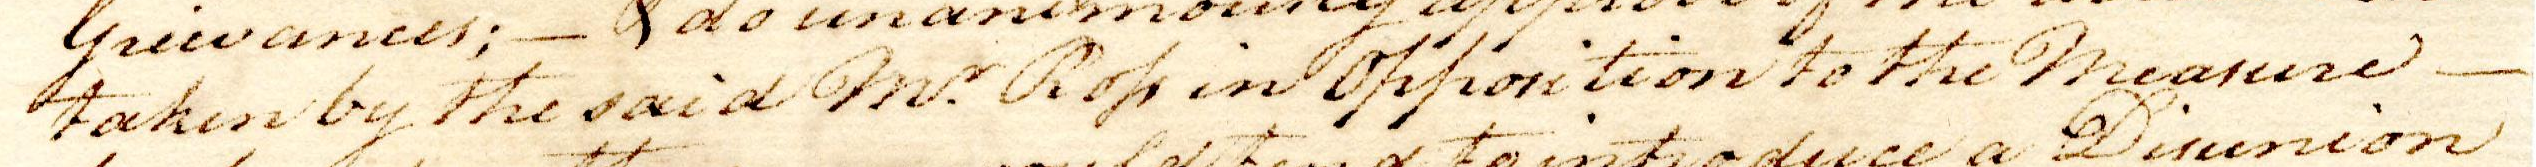taken by the said M^r. Ross in Opposition to the Measure-
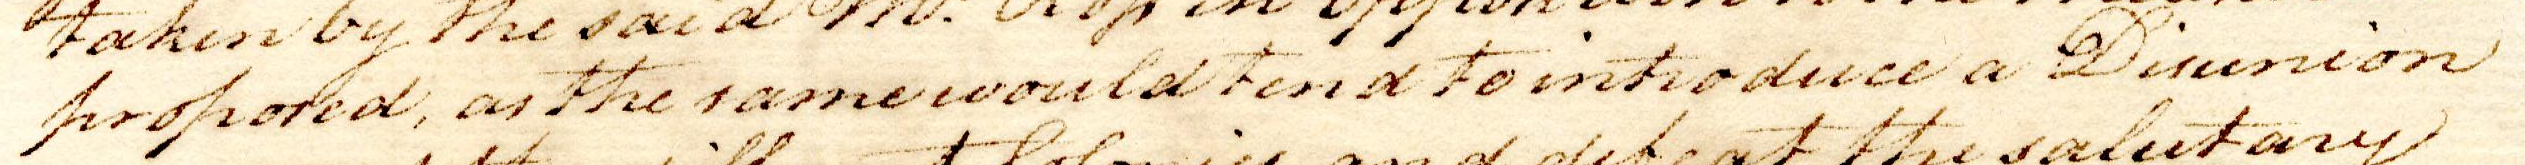proposed, as the same would tend to introduce a Disunion
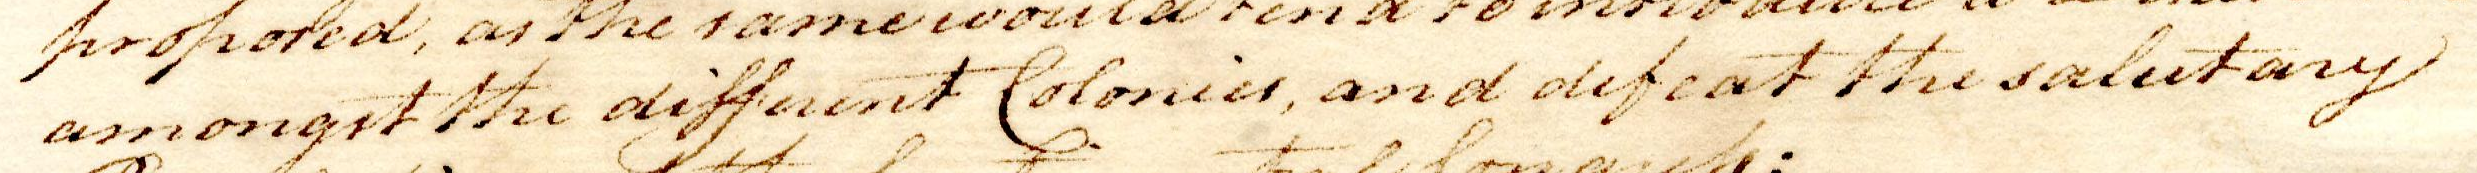amongst the different Colonies, and defeat the salutary
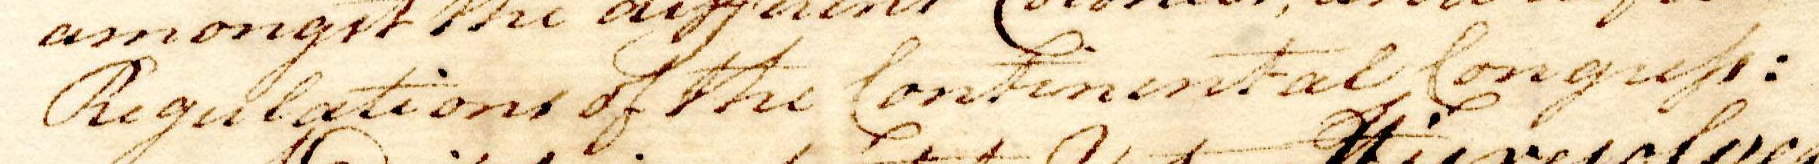Regulations of the Continental Congress:
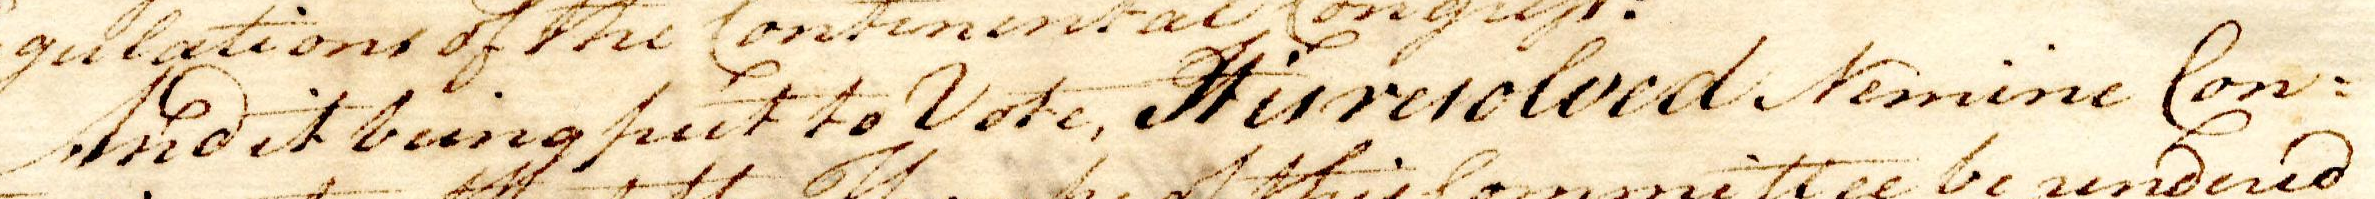And it being put to Vote, His resolved Nemine Con-
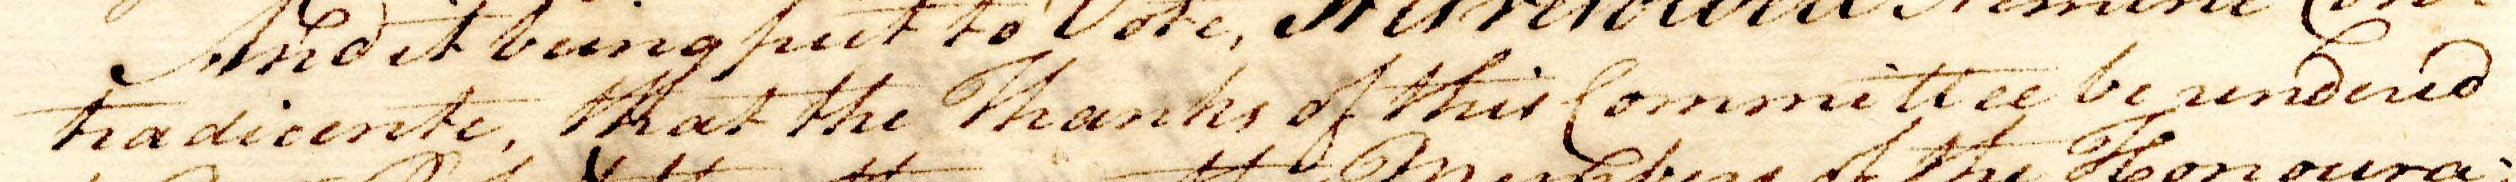-tradicente, that the Thanks of this Committee be rendered
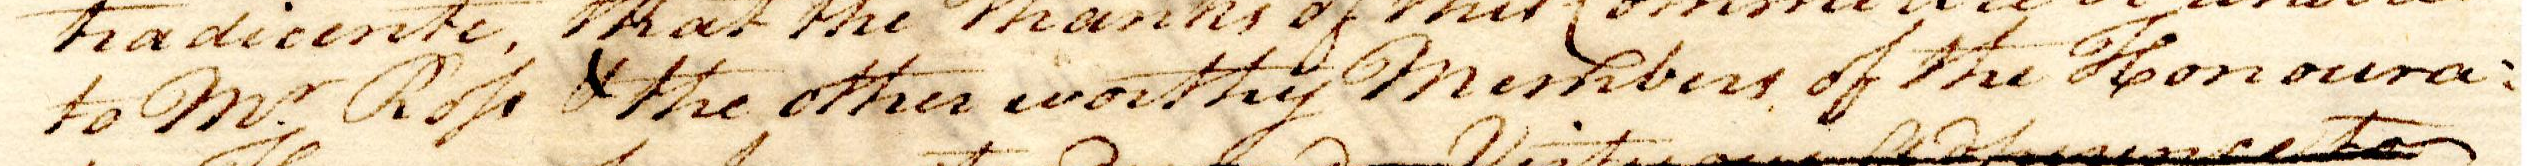to M^r. Ross & the other worthy members of the Honoura-
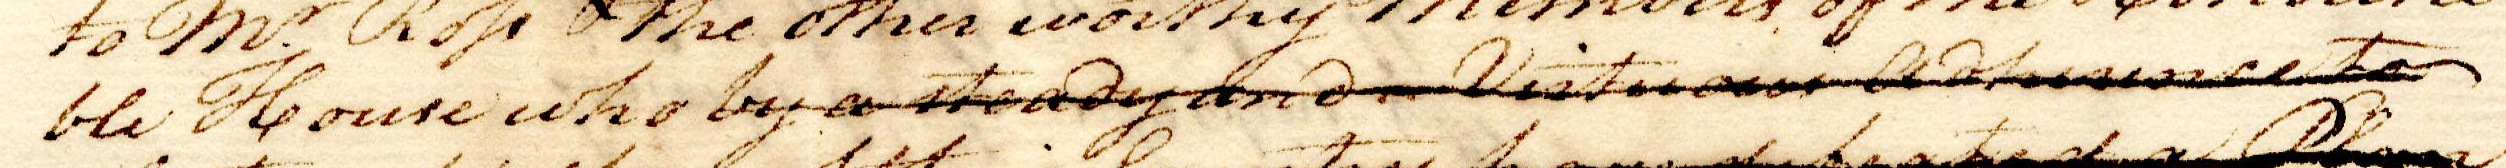-ble House who [by a steady and a Virtuous Assurance to]
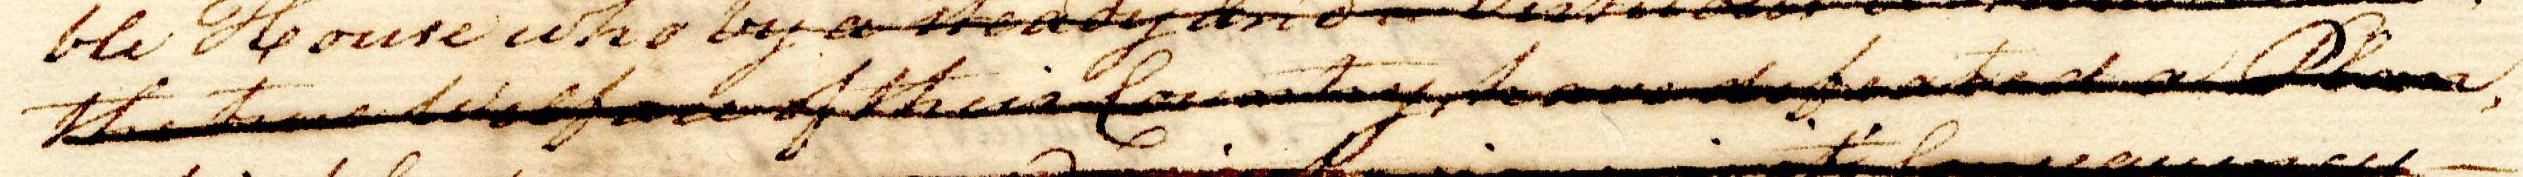[the true] [_______] [are of their Country Law defeated a Plan,]
